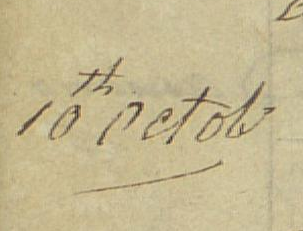10^th Octob^r
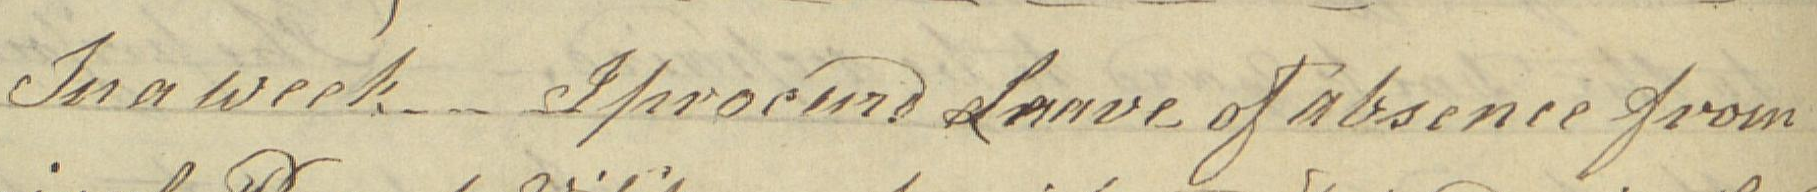In a week, I procurd Leave of absence from
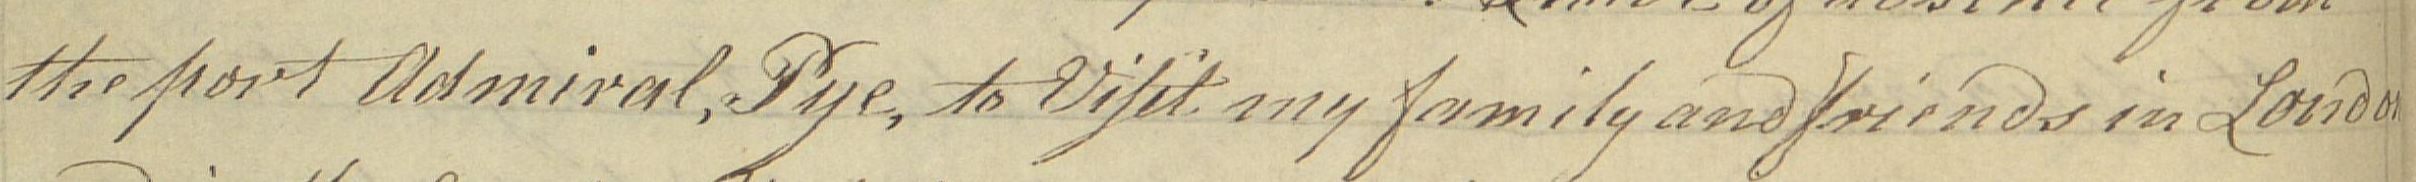the port Admiral, Pye, to Visit my family and friends in London
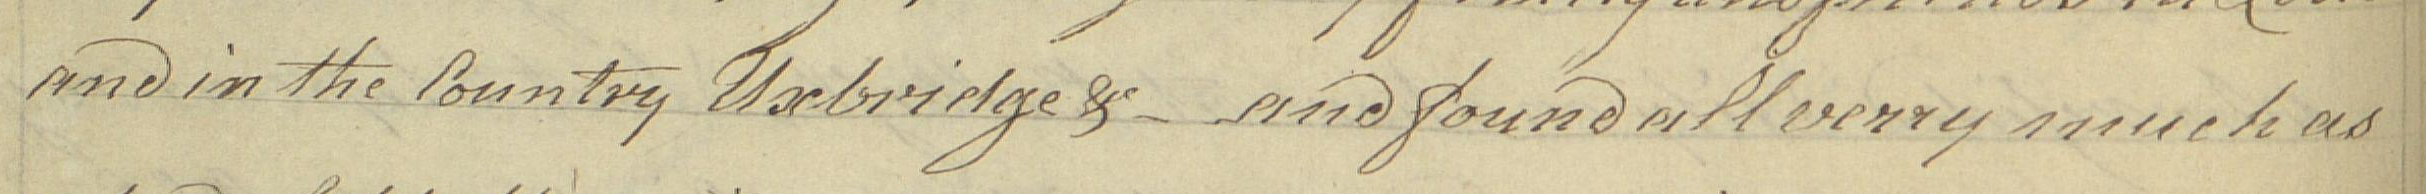and in the Country Uxbridge &c and found all verry much as
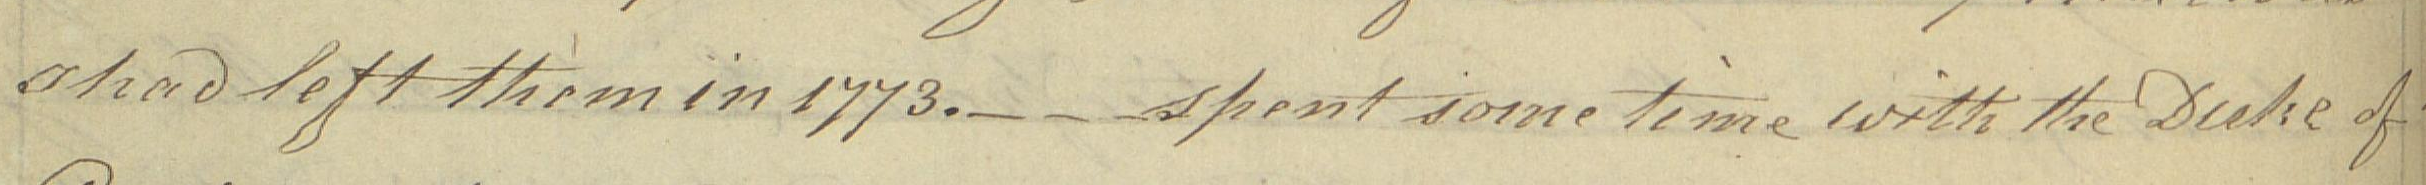I had left them in 1773. spent some time with the Duke of
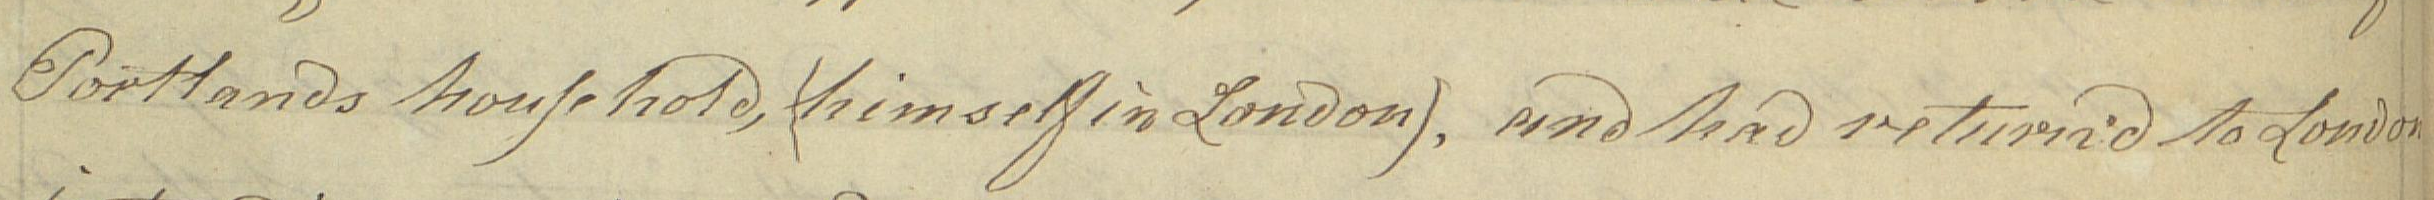Portlands house hold (himself in London), and had return'd to London
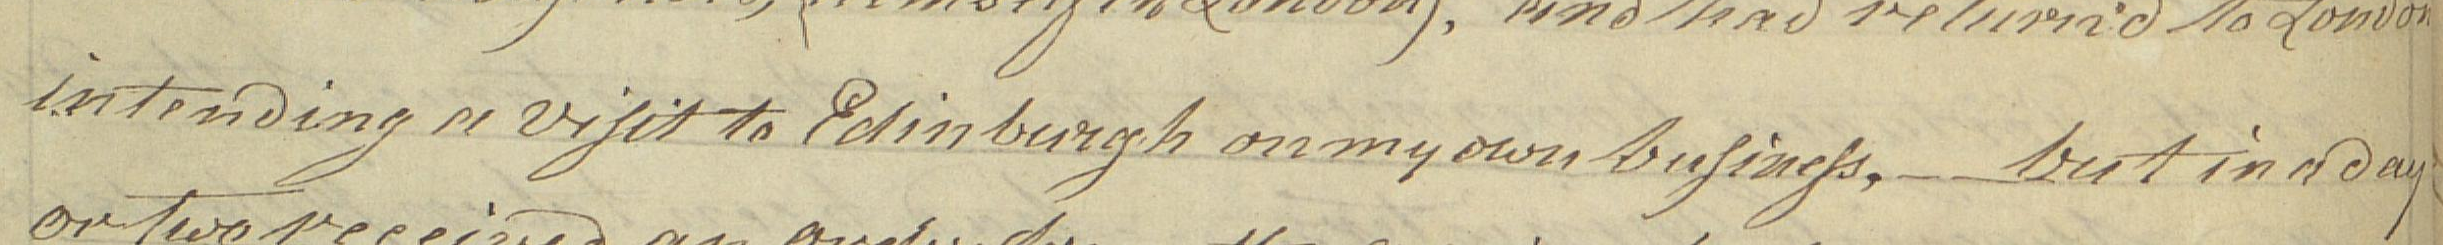intending a visit to Edinburgh on my own business, but in a day
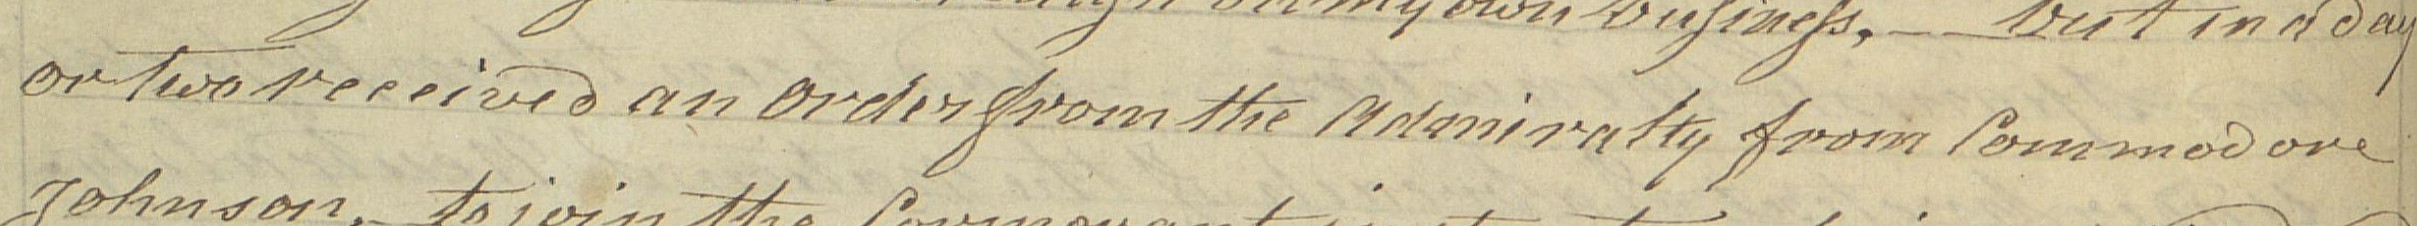or two received an order from the Admiralty from Commodore
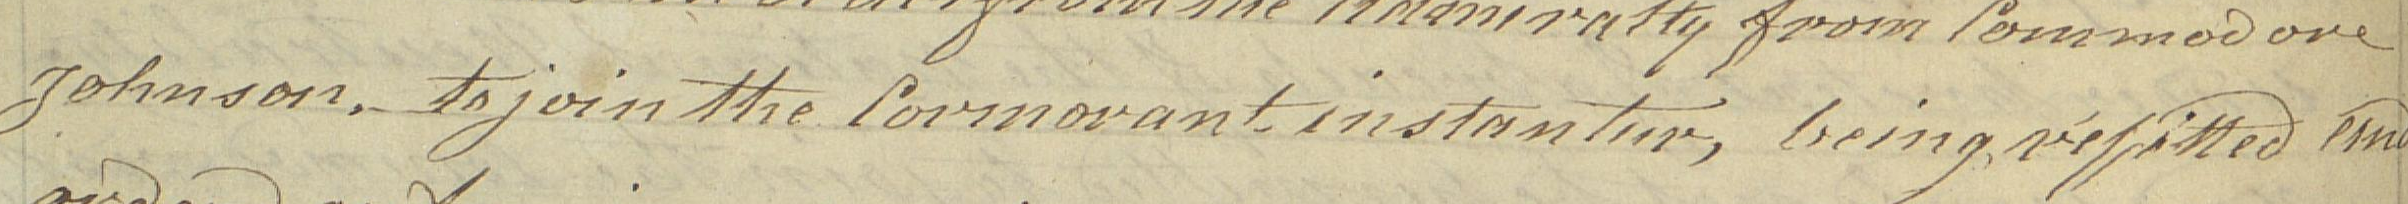Johnson, to join the Cormorant instantur, being ressitted and
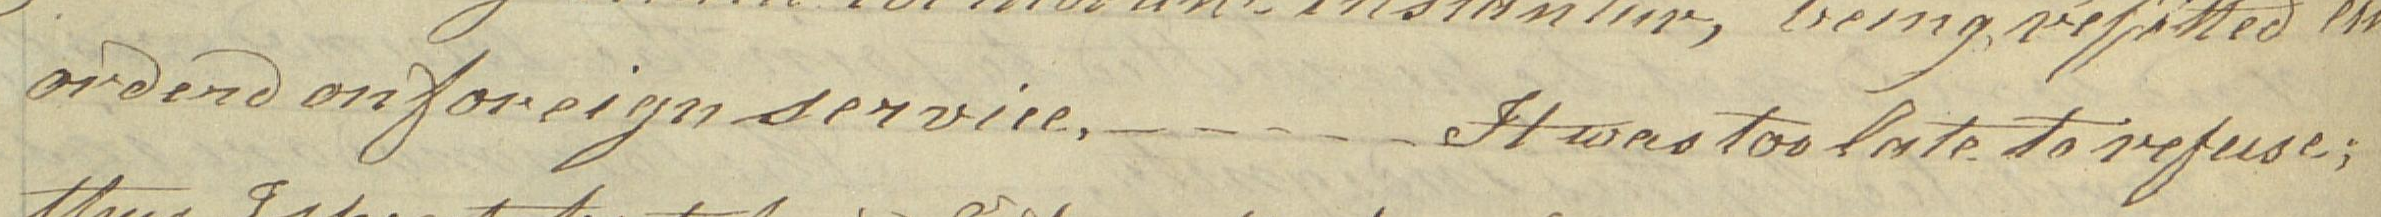orderd on foreign service. It was too late to refuse;
